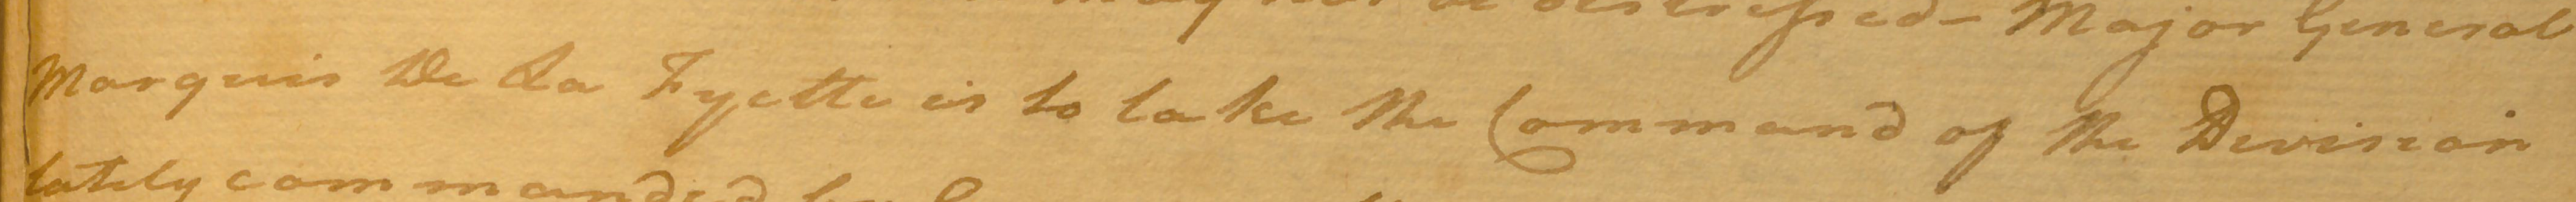Marquis De La Fyette is to take the Command of the Division
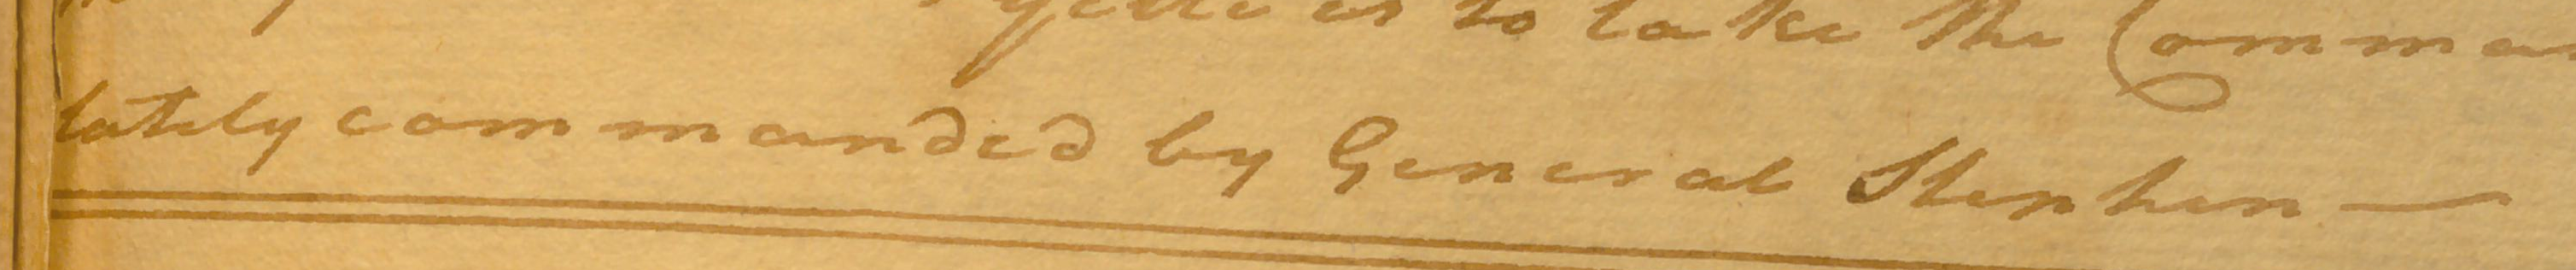lately commanded by General Stephen-
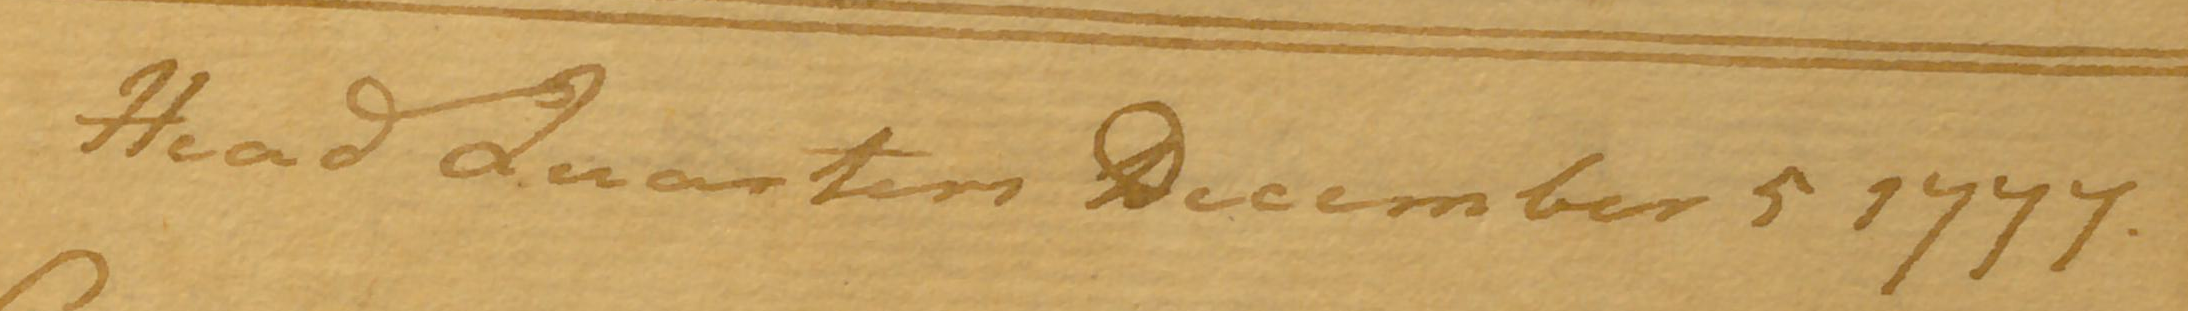Head Quarters December 5 1777.
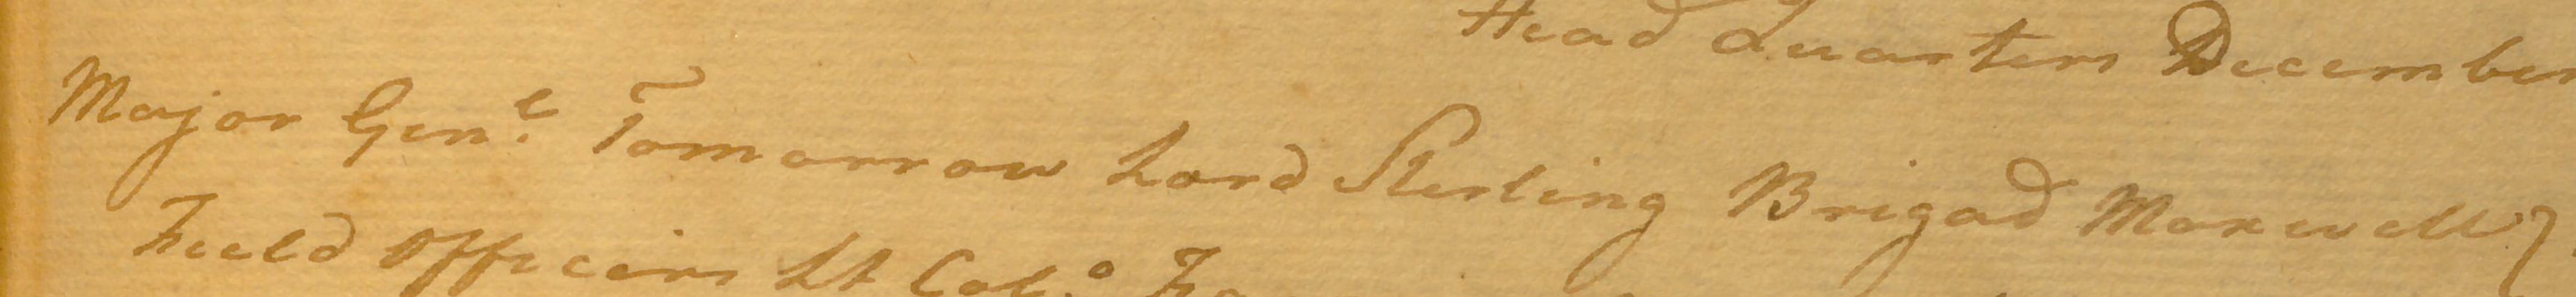Major Gen^l. Tomorrow Lord Sterling Brigad Maxwell
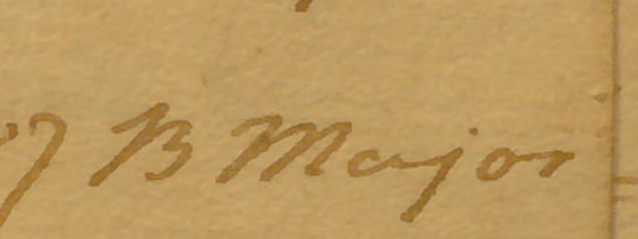B Major
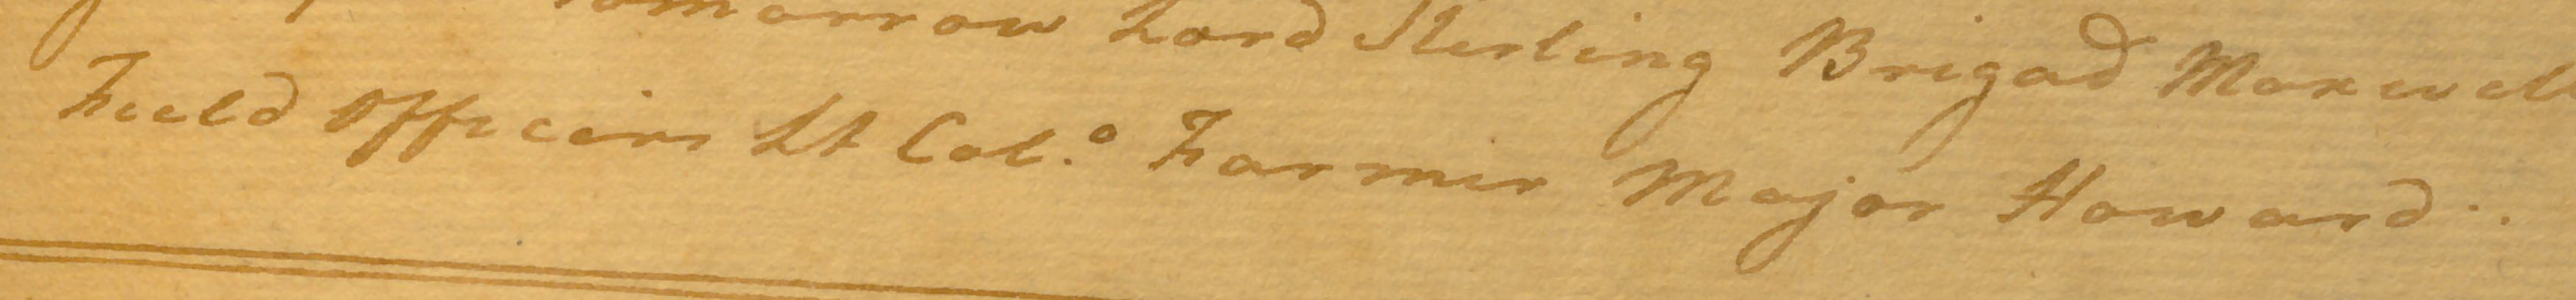Field Officers Lt Col^o. Farmir Major Howard
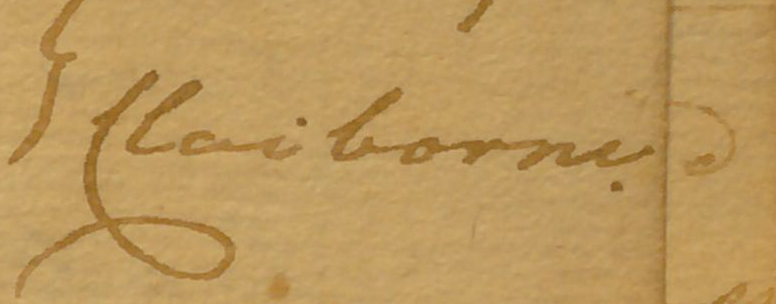Claiborne.
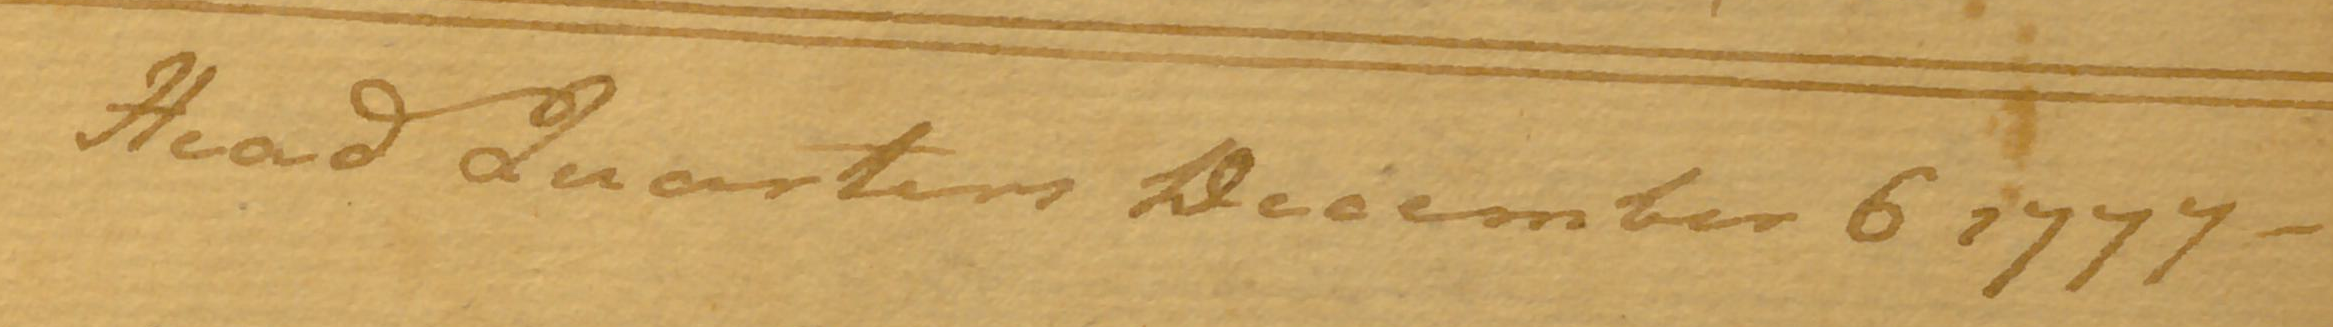Head Quarters December 6 1777-
